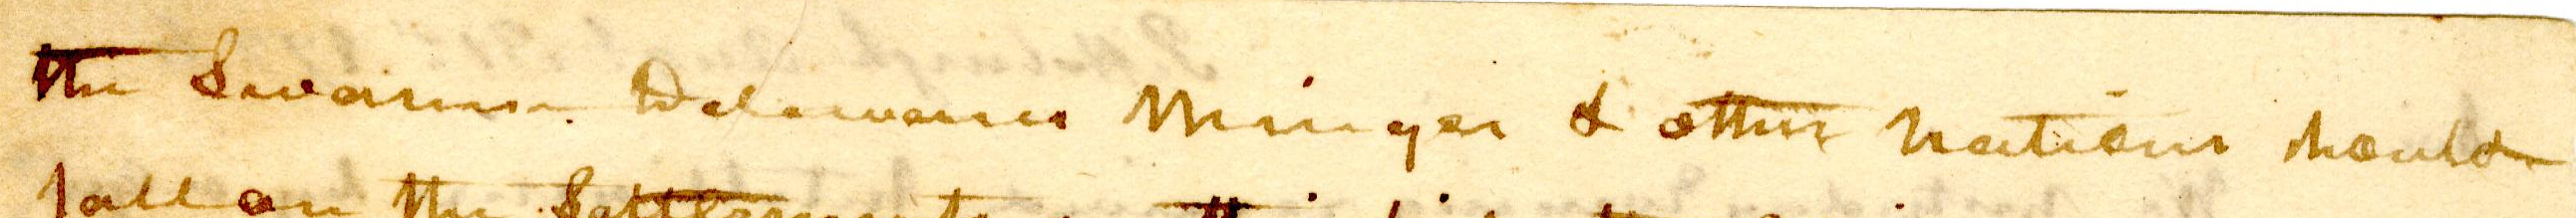the Sawanees Delawares Mingos & other nations should
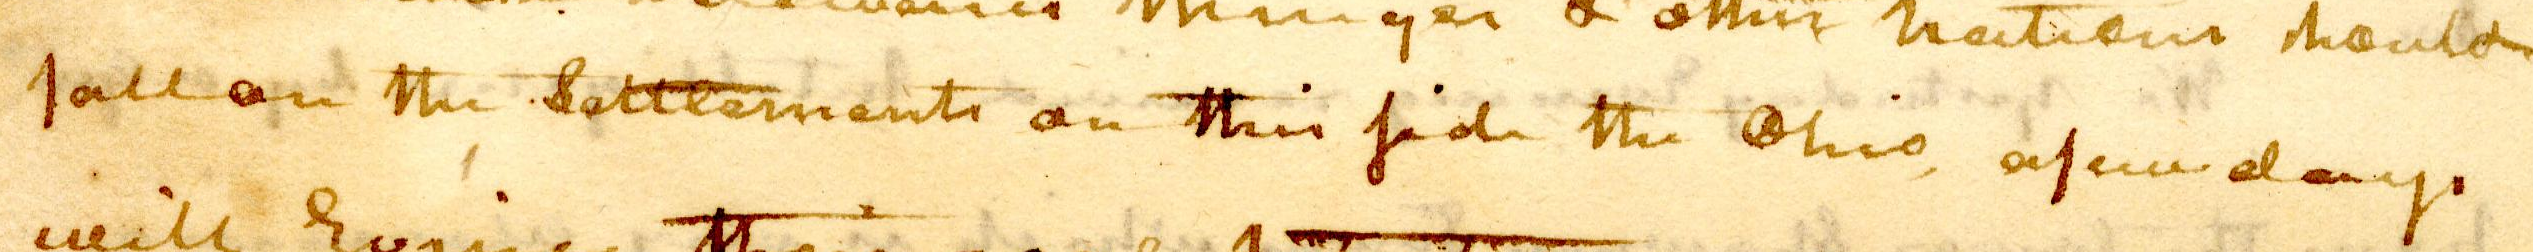fall on the Settlements on this side the Ohio, a few days
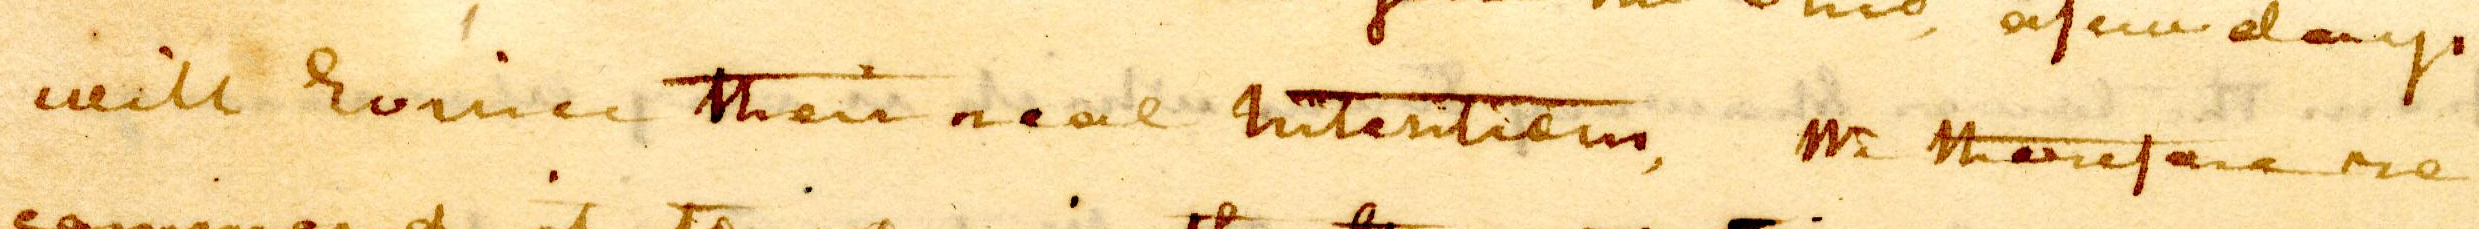will Evince their real intentions, We therefore re
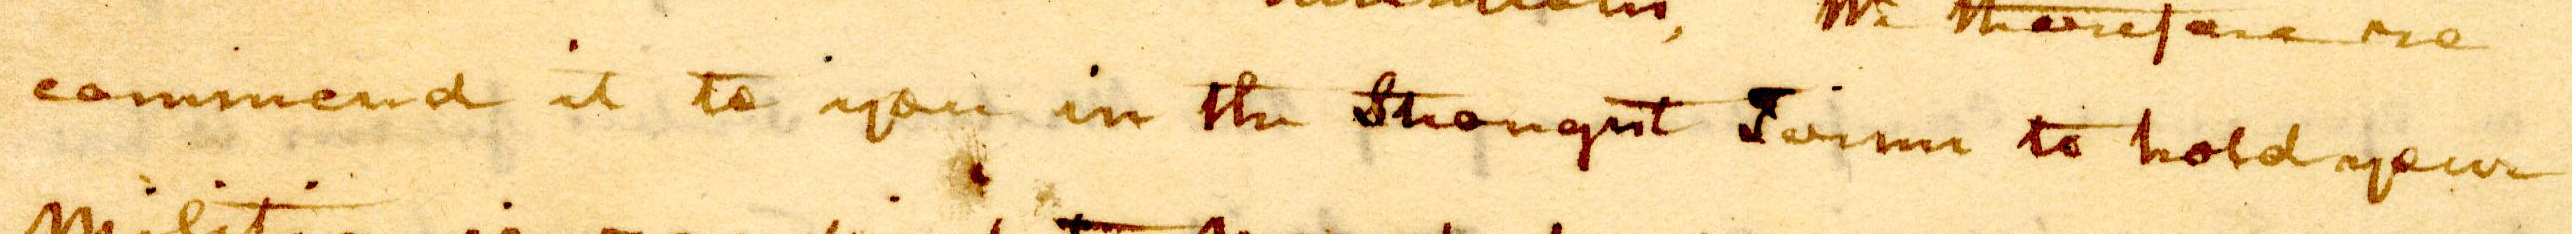commend it to you in the Strongest Term to hold your
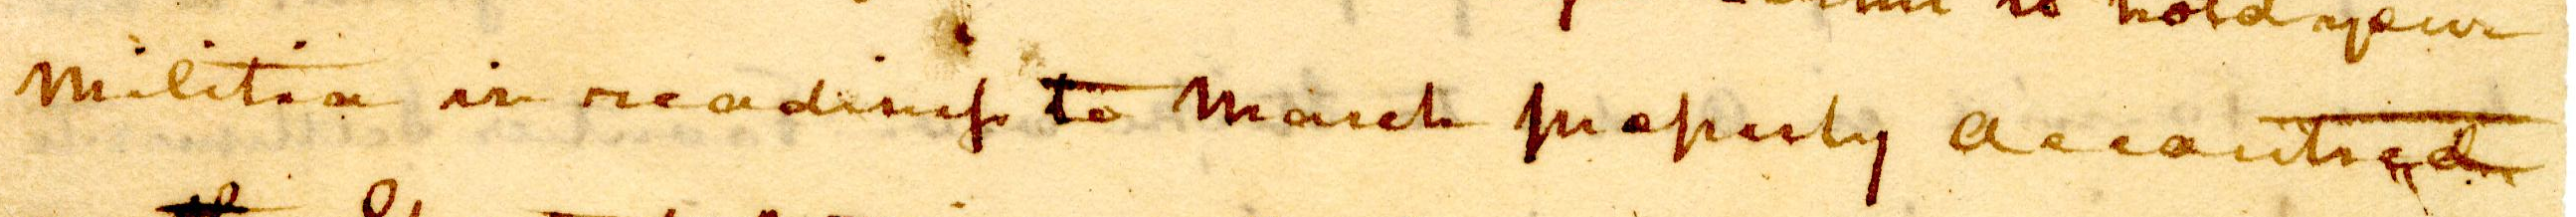militia in readiness to march properly accoutred
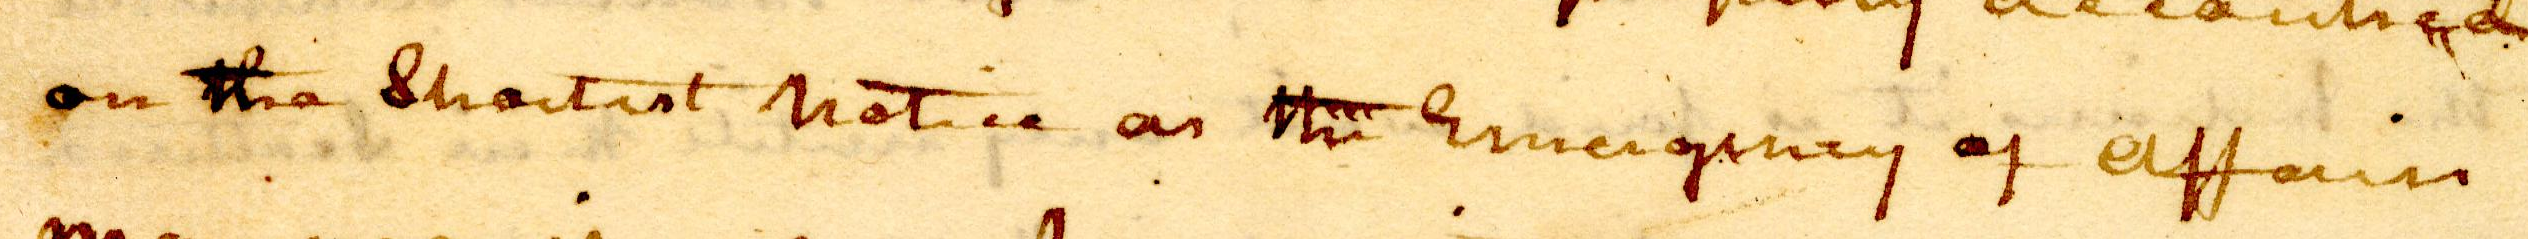on the Shortest Notice as the Emergency of Affairs
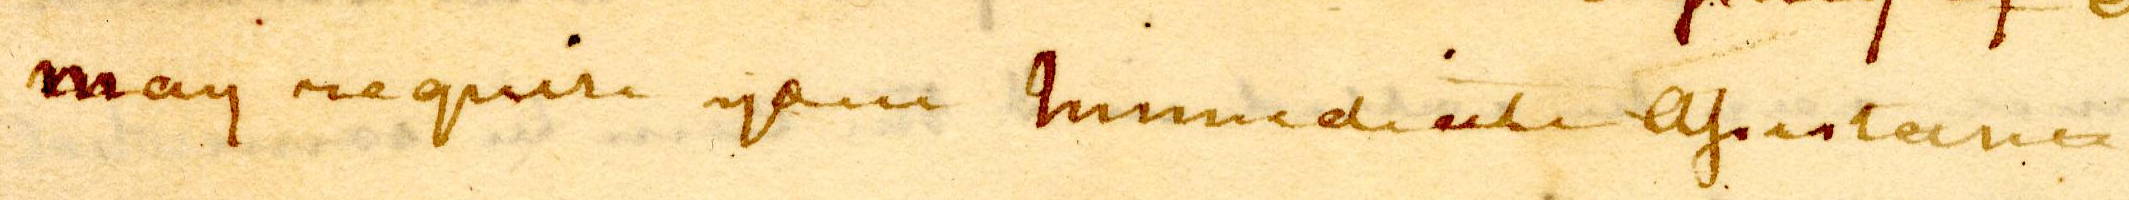may require your Immediate Assistance
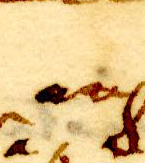are
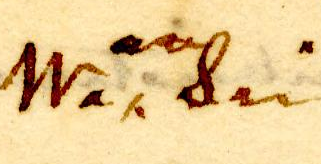We ^ Sir
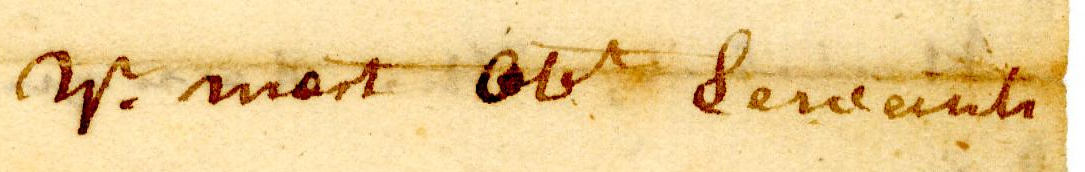Y^r. most Ob^t Servants
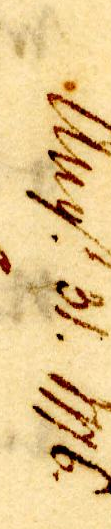Aug^t. 31. 1776.
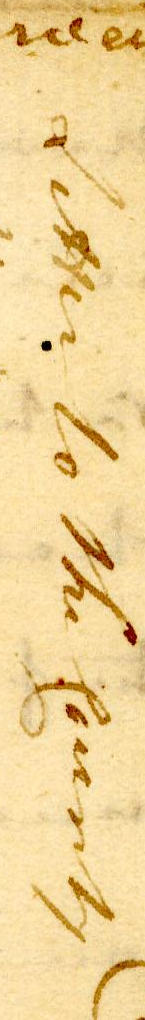Letter to the County
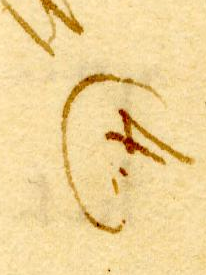4.
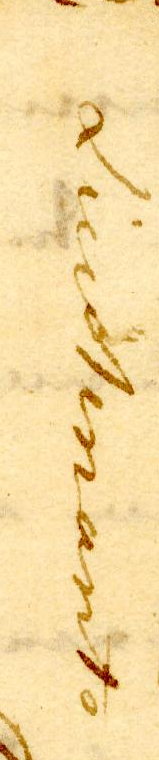Lieutenant
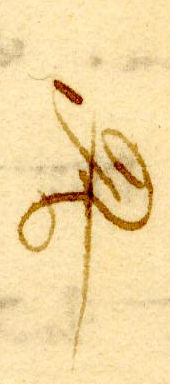R
